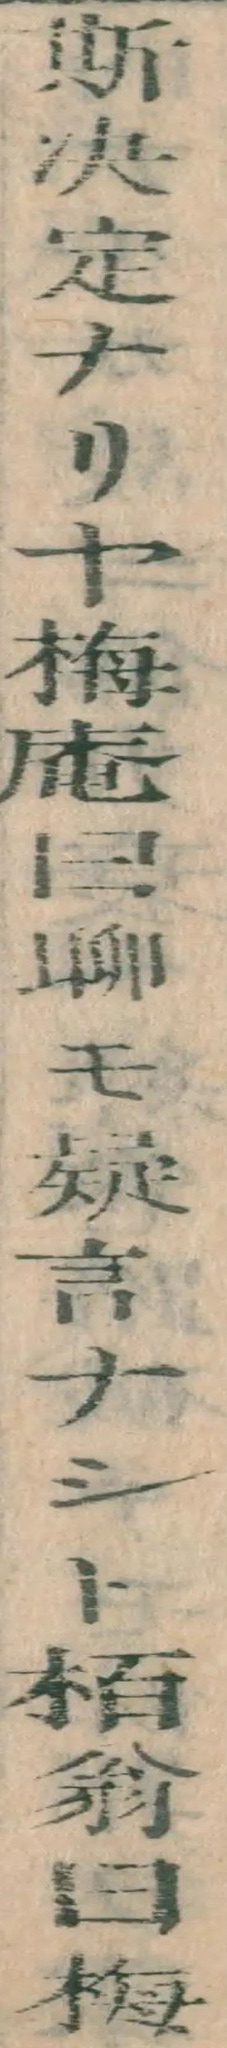斯决定ナリヤ梅庵曰聊モ疑言ナシト栢翁曰梅
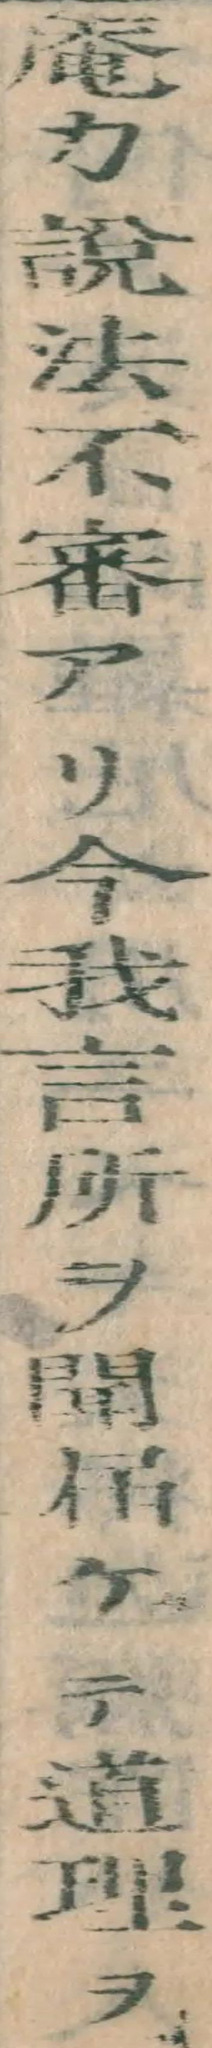庵カ説法不審アリ今我言所ヲ聞届ケテ道理ヲ
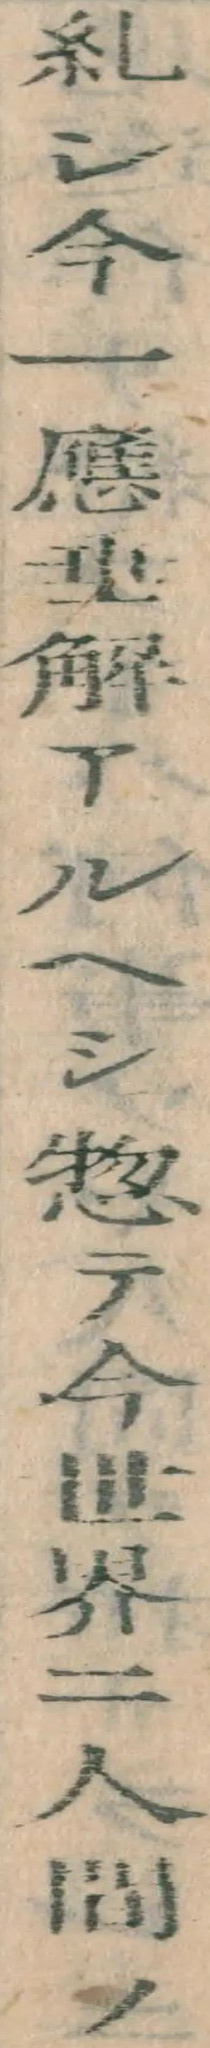糺シ今一応垂解アルヘシ惣テ今世界ニ人間ノ
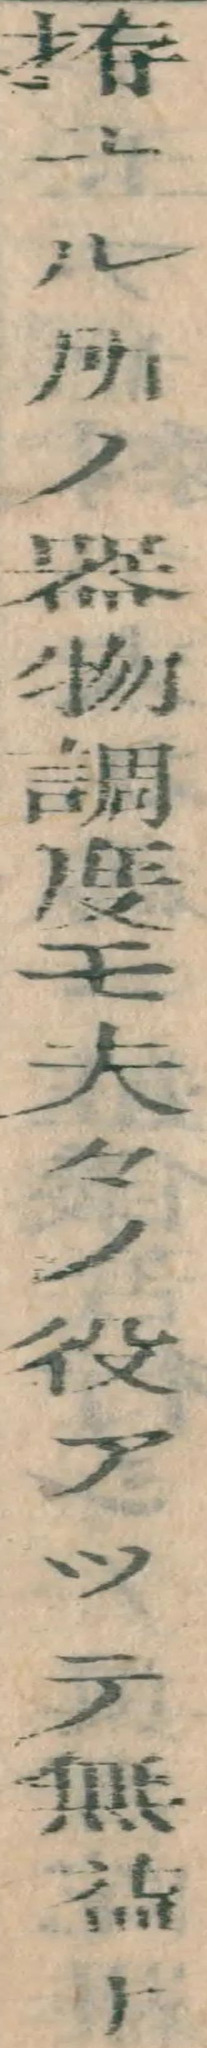拵ユル所ノ器物調度モ夫々ノ役アツテ無益ナ
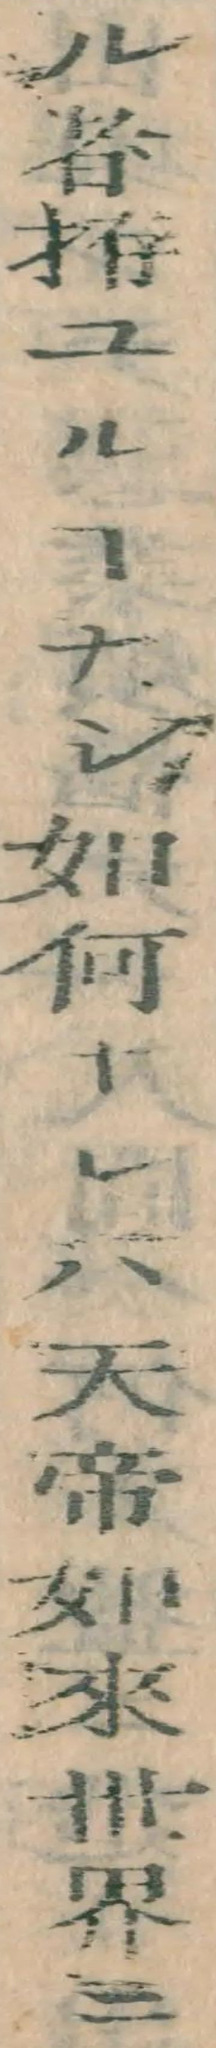ル者拵ユルヿナシ如何ナレハ天帝如来世界ニ

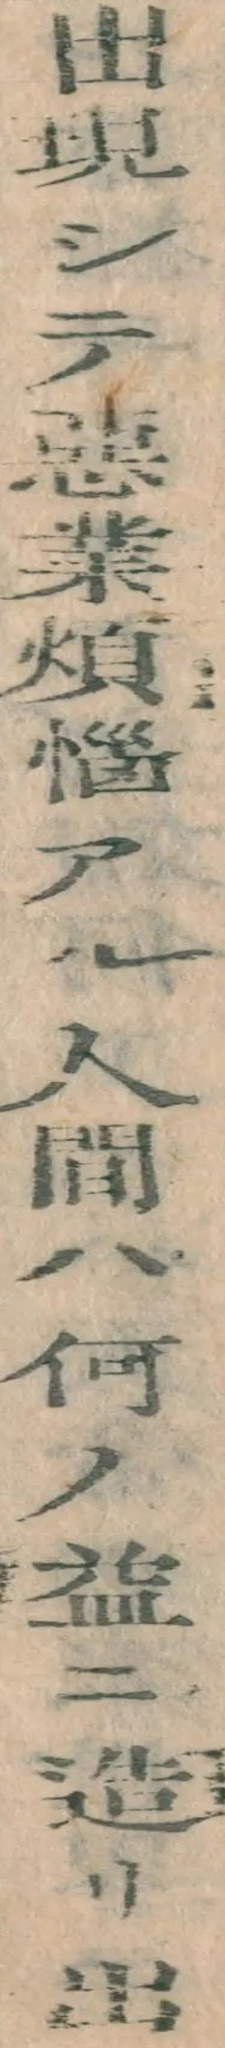出現シテ悪業煩悩アル人間ハ何ノ益ニ造リ出
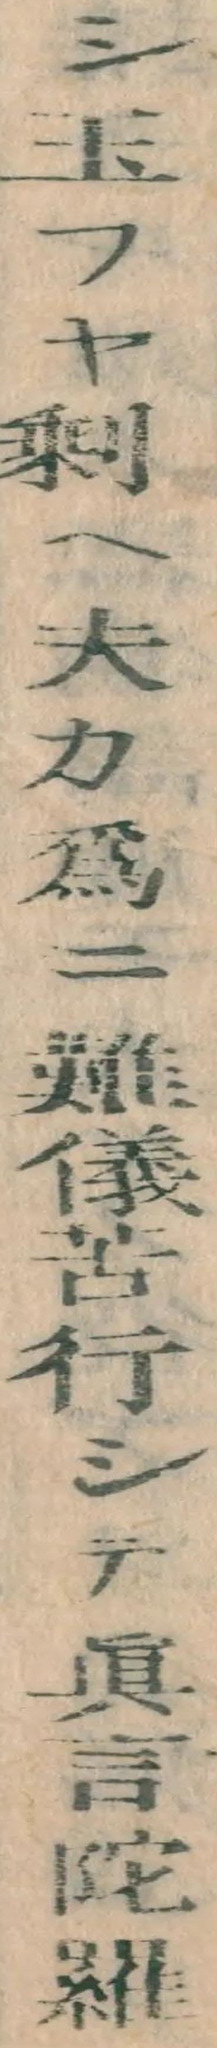シ玉フヤ剰ヘ夫カ為ニ難儀苦行シテ真言陀羅
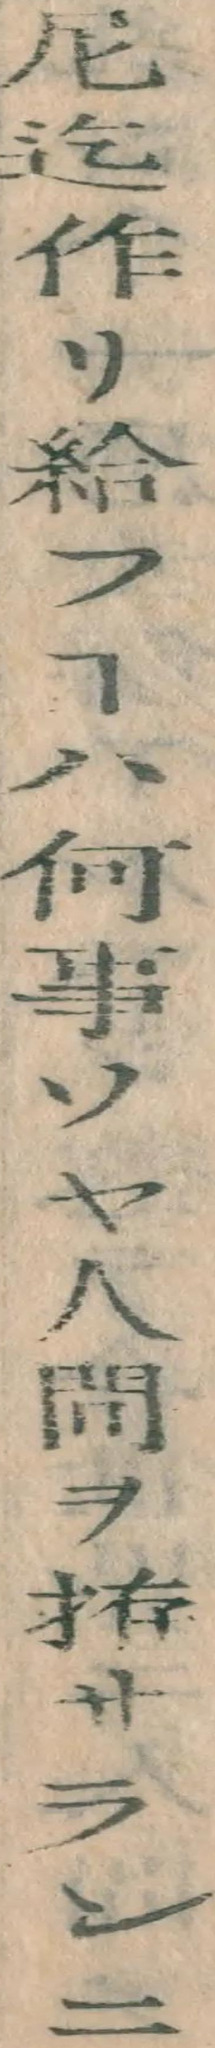尼迄作リ給フヿハ何事ソヤ人間ヲ拵サランニ
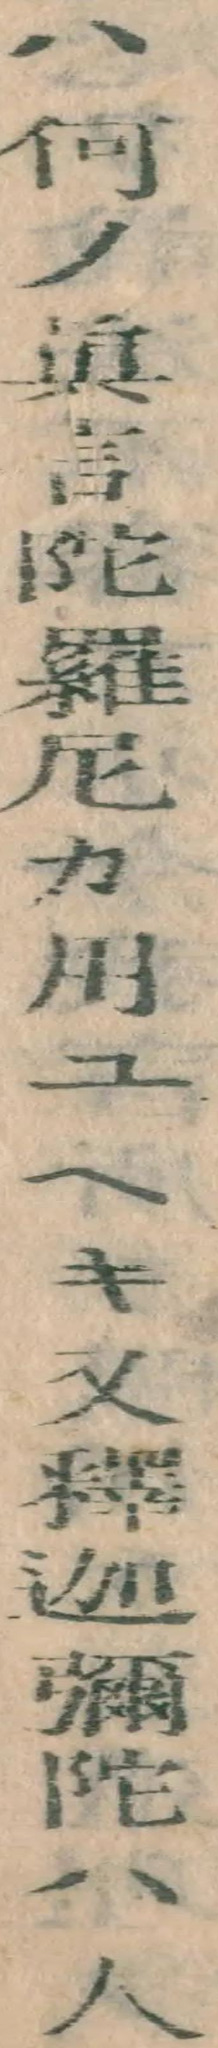ハ何ノ真言陀羅尼カ用ユヘキ又釈迦弥陀ハ人
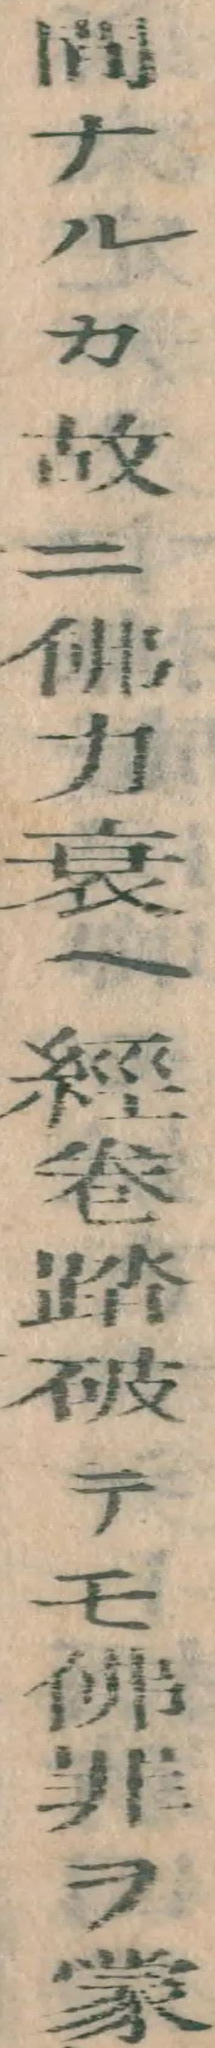間ナルカ故ニ仏力衰ヘ経巻踏破テモ仏罪ヲ蒙
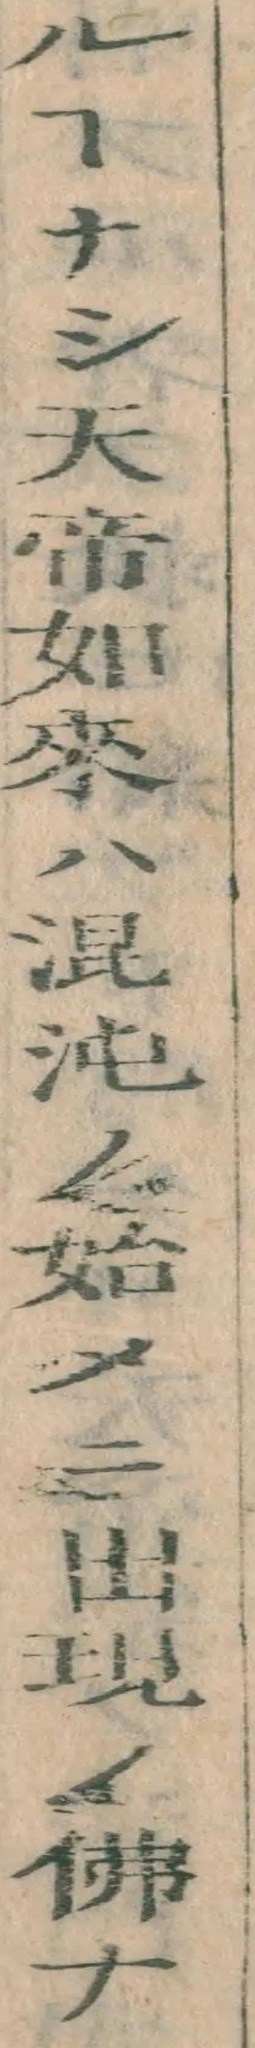ルヿナシ天帝如来ハ混沌ノ始メニ出現ノ仏ナ
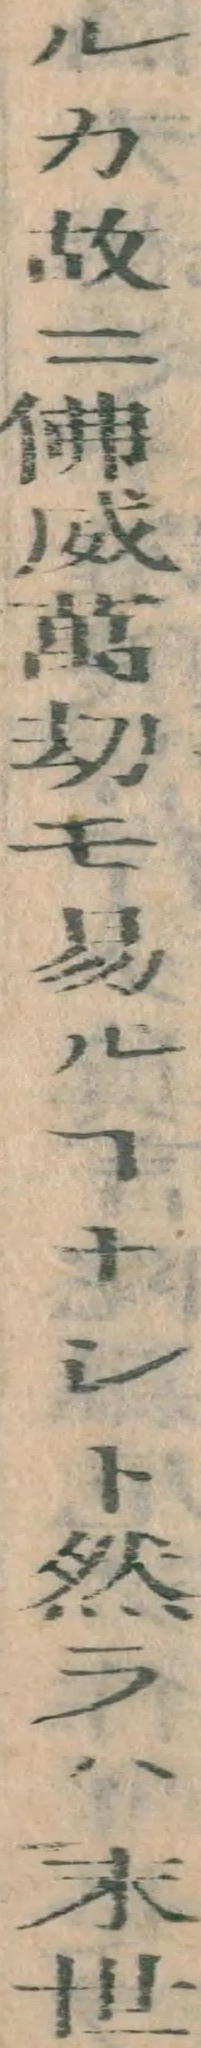ルカ故ニ仏威万劫モ易ルヿナシト然ラハ末世
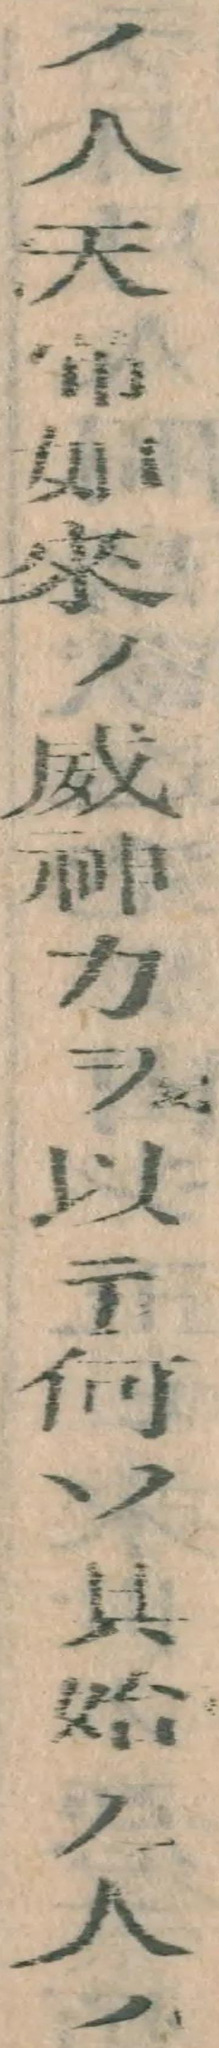ノ人天帝如来ノ威神力ヲ以テ何ソ其始ノ人ノ
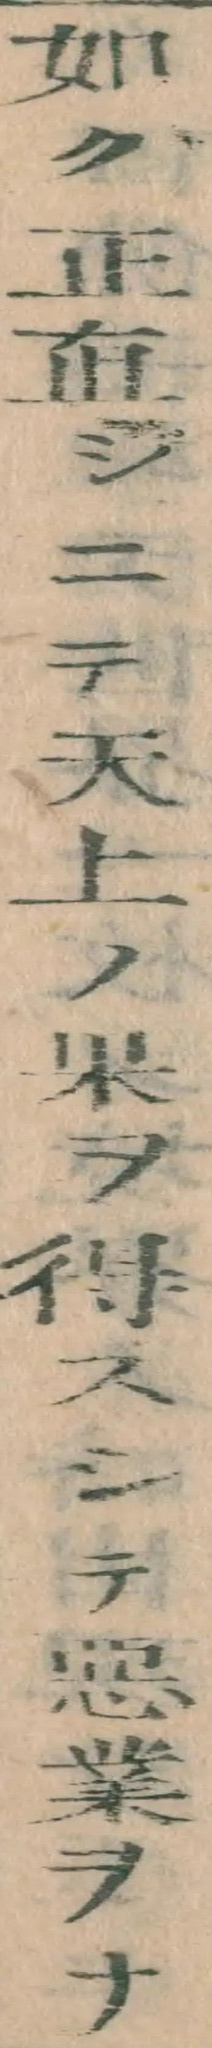如ク正直シニテ天上ノ果ヲ得スシテ悪業ヲナ
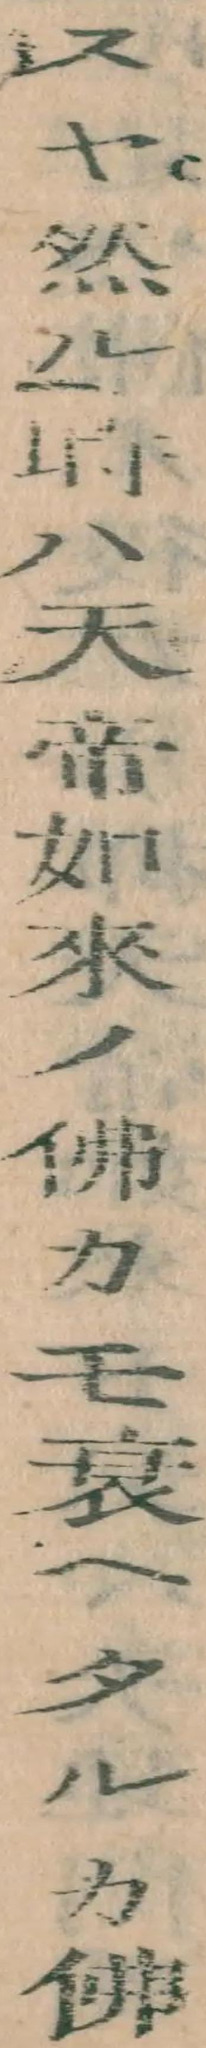スヤ然ル時ハ天帝如来ノ仏力モ衰ヘタルカ仏
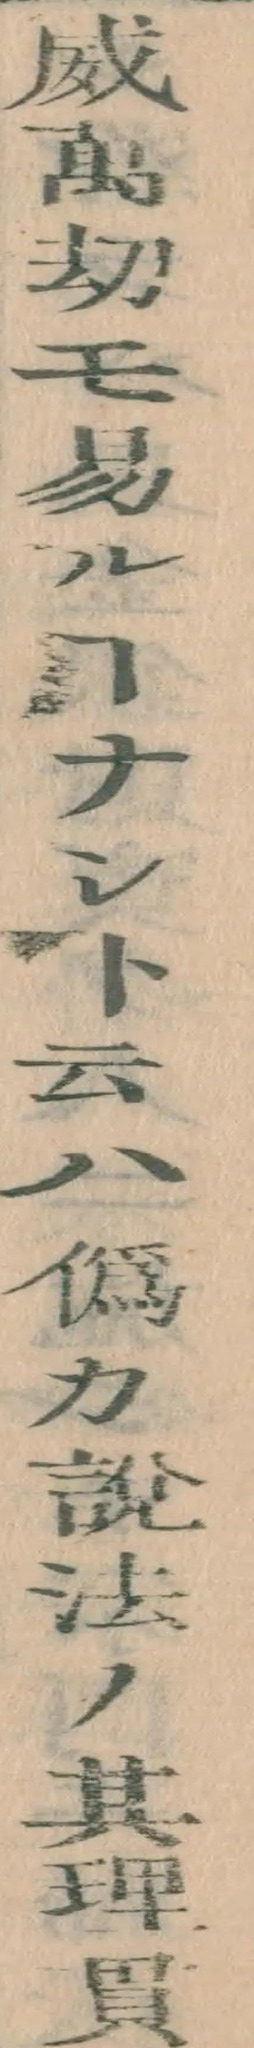威万劫モ易ルヿナシト云ハ偽カ説法ノ其理貫
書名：南蛮寺興廃記
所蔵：国立国会図書館 National Diet Library, JAPAN
